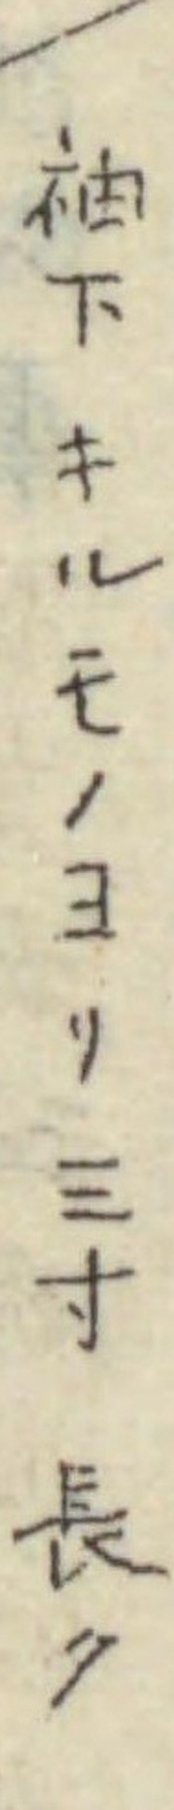袖下キルモノヨリ三寸長ク
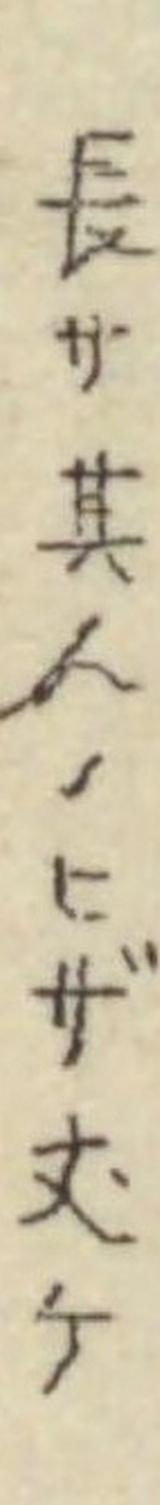長サ其人ノヒザ丈ヶ
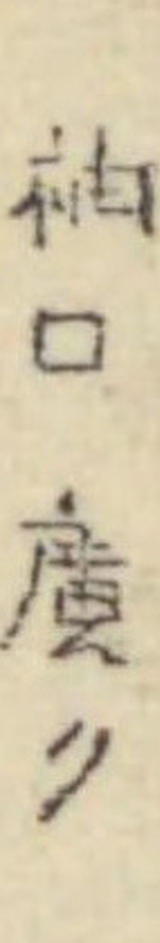袖口広ク
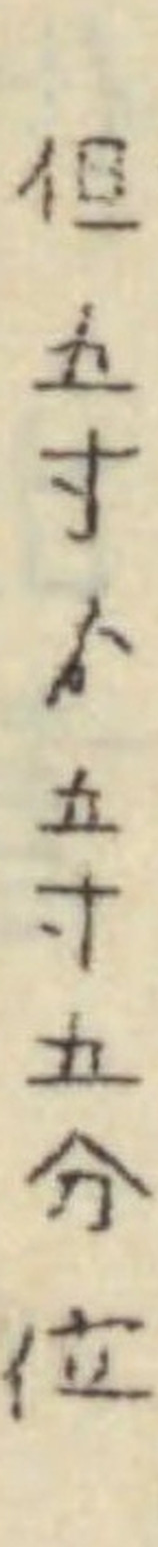但五寸ゟ五寸五分位
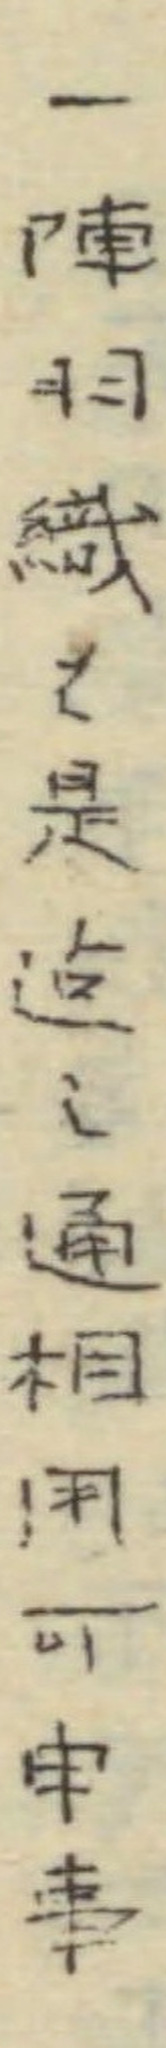一陣羽織は是迄之通相用可申事
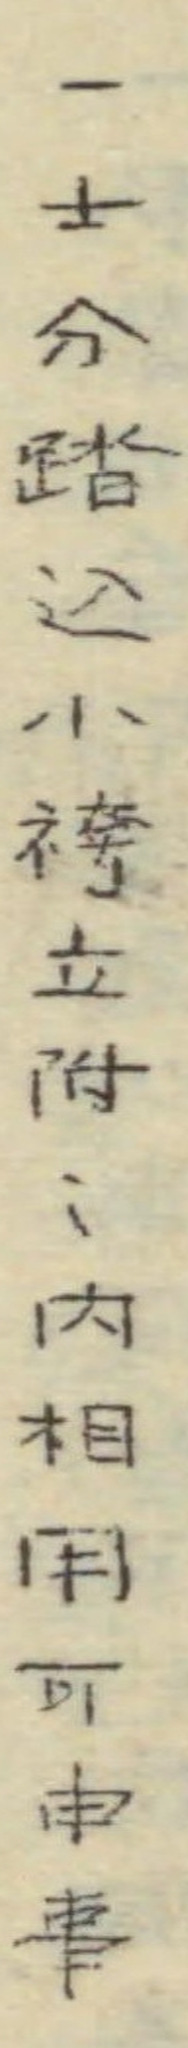一士分踏込小袴立附之内相用可申事
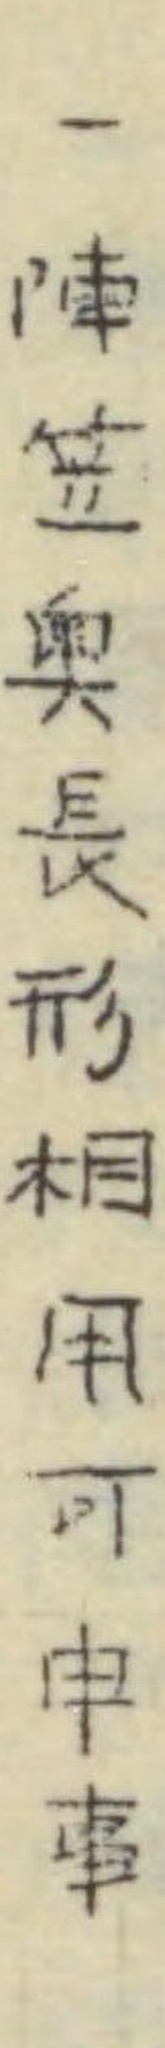一陣笠奥長形相用可申事
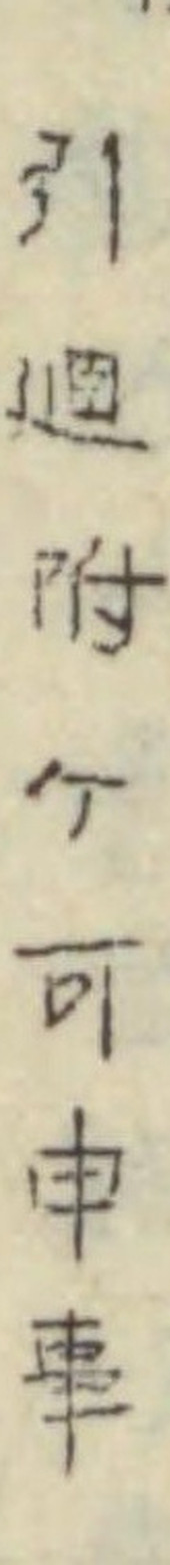但引廻附ヶ可申事
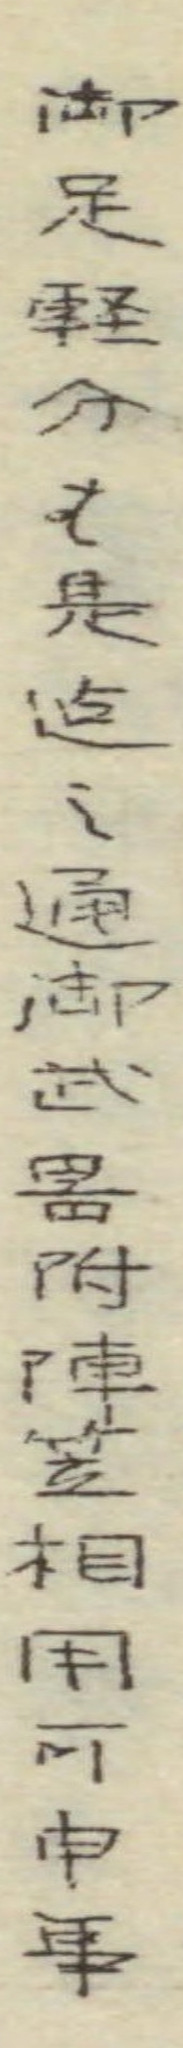御足軽分は是迄之通御武器附陣笠相用可申事
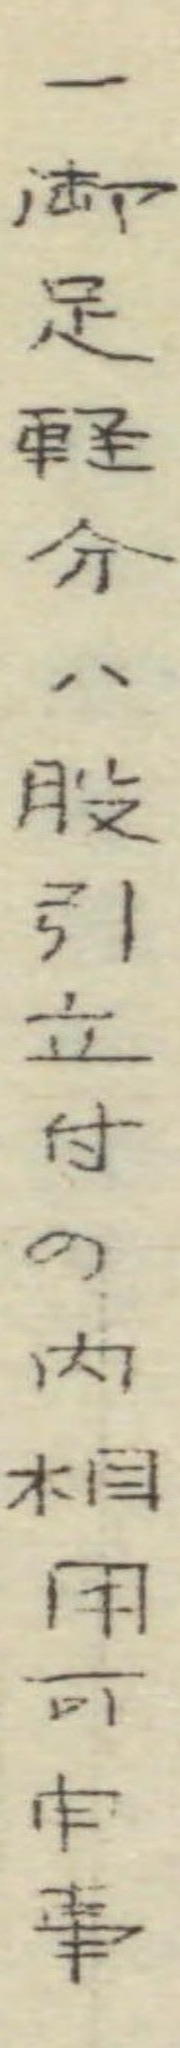一御足軽分ハ股引立付の内相用可申事
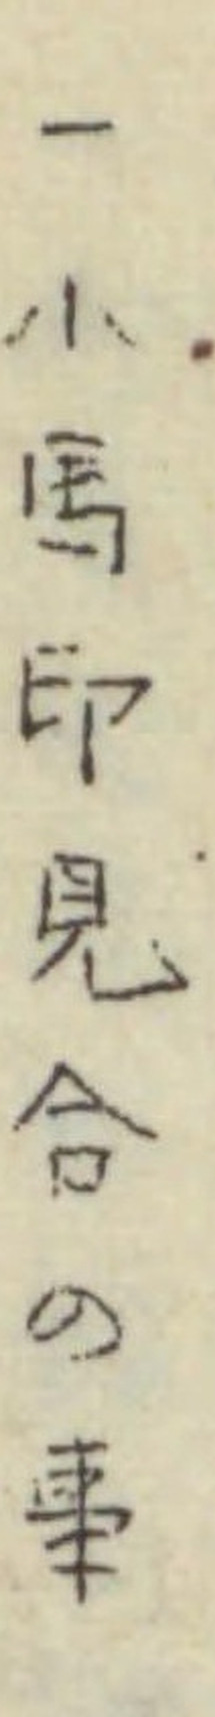一小馬印見合の事
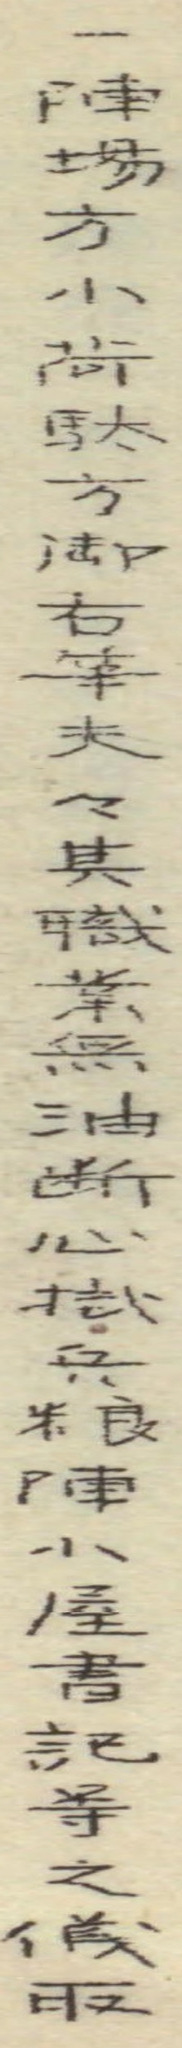一陣場方小荷駄方御右筆夫々其職業無油断心掛兵糧陣小屋書記等之儀取
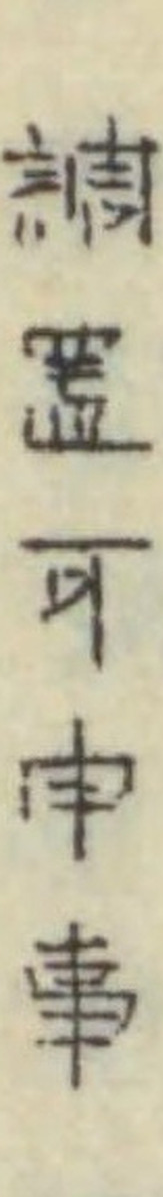調置可申事
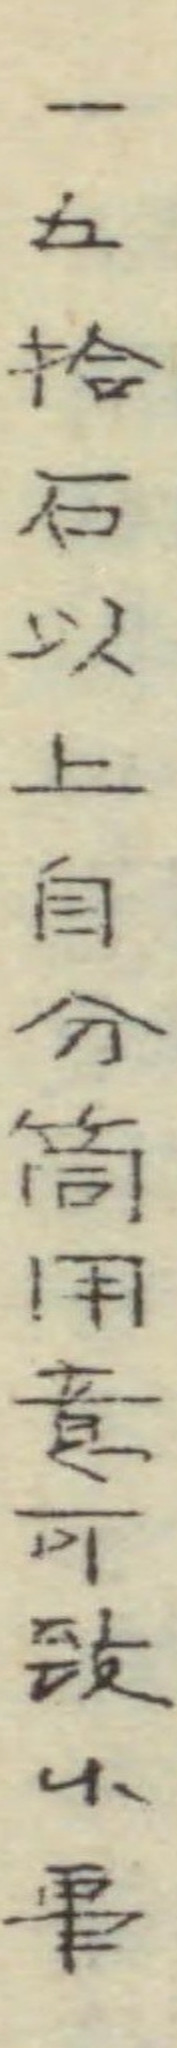一五十石以上自分筒用意可致候事
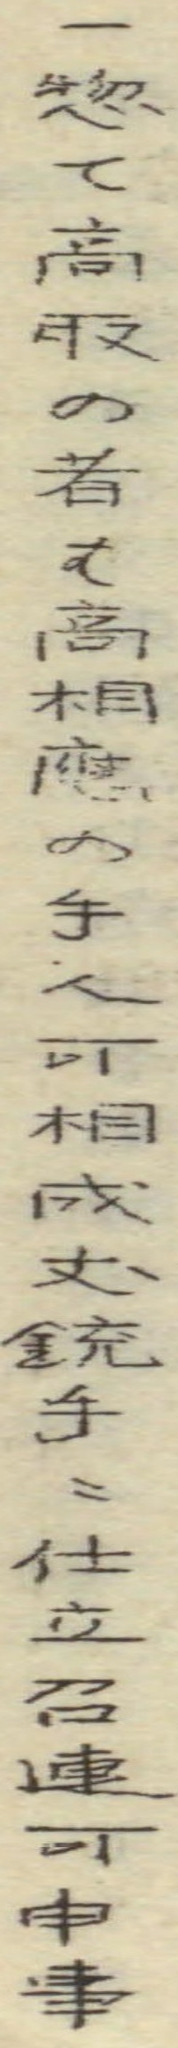一惣て高取の者は高相応の手認可相成丈銃手二仕立召連可申事
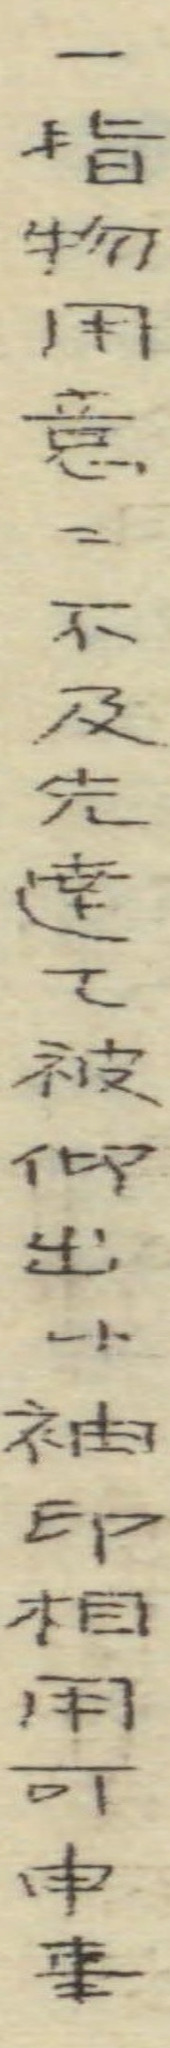一指物用意二不及先達て被仰出候袖印相用可申事
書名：三河吉田藩動員史料
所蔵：国立国会図書館 National Diet Library, JAPAN
